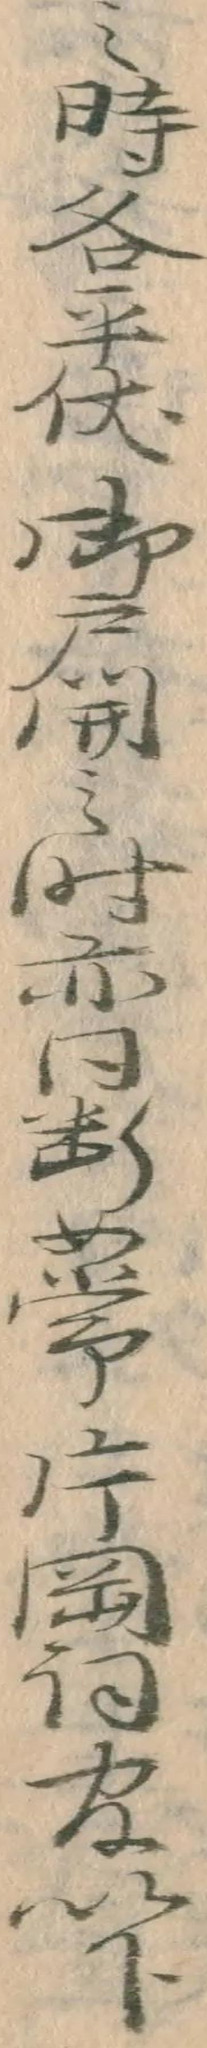之時各平伏御戸開之時亦同断如常片岡詞官以下
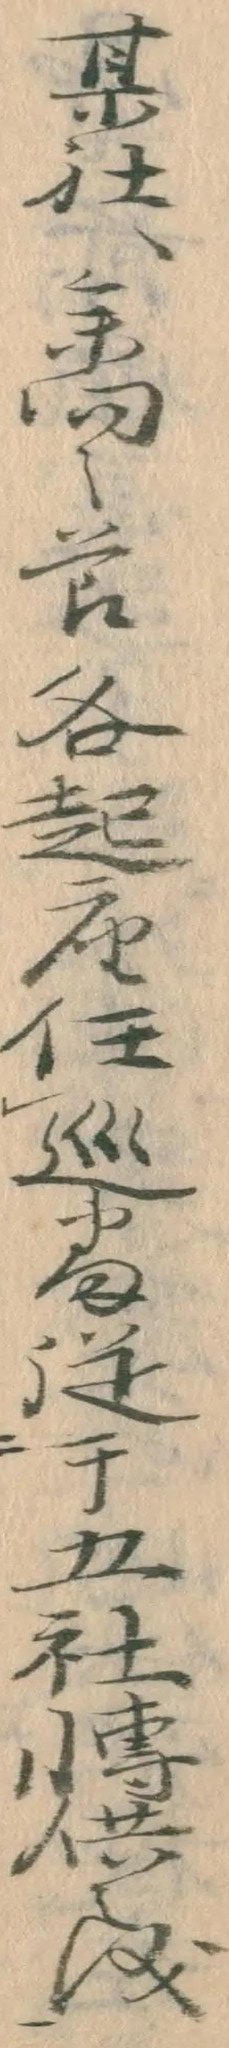某社へ参向之節各起座任巡番従于五社轉供之儀
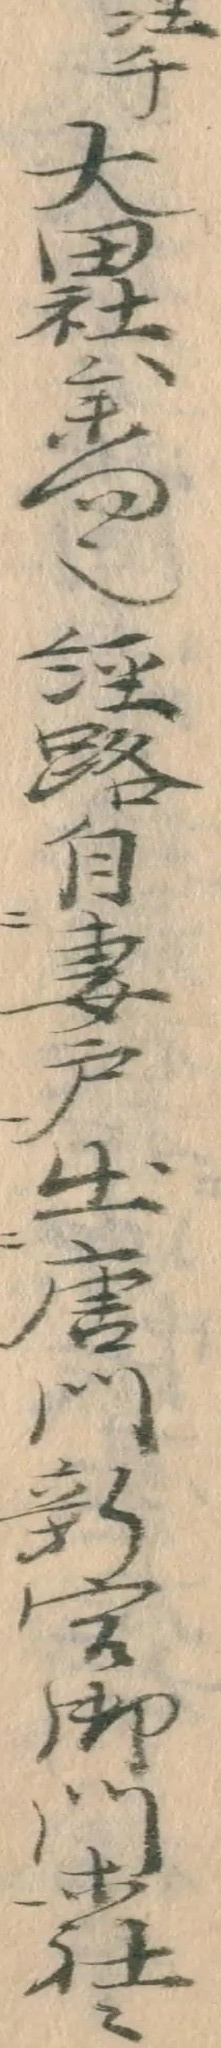経千大田社へ参向也経路自妻戸出唐門新宮御門等社々
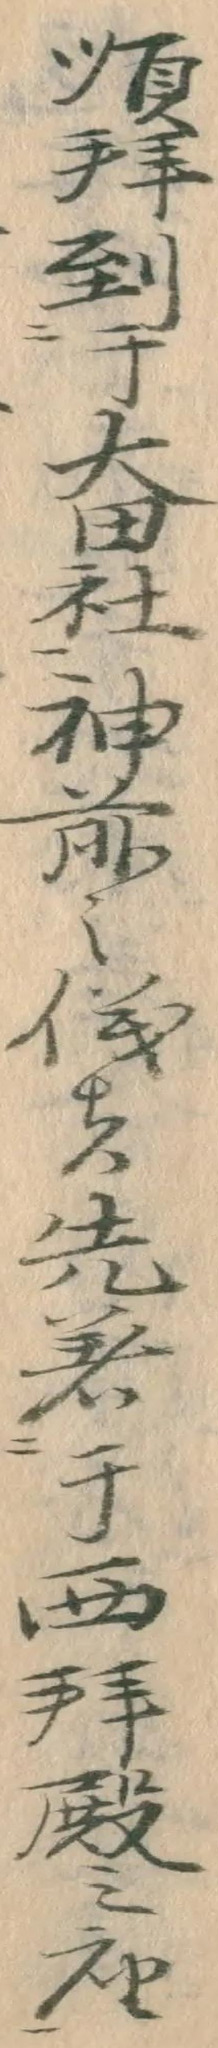順拜到于大田社神前之儀者先着于西拜殿之座
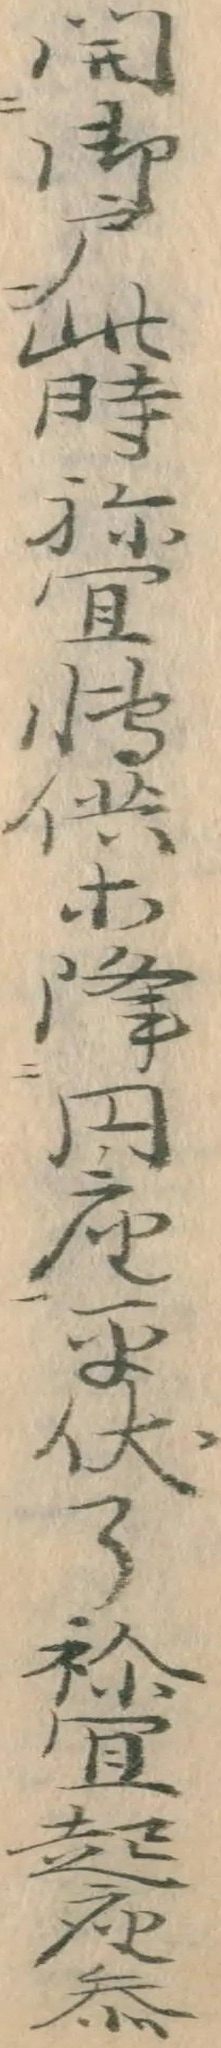開御戸此時称宜轉供等降円座平伏了祢宜起座参

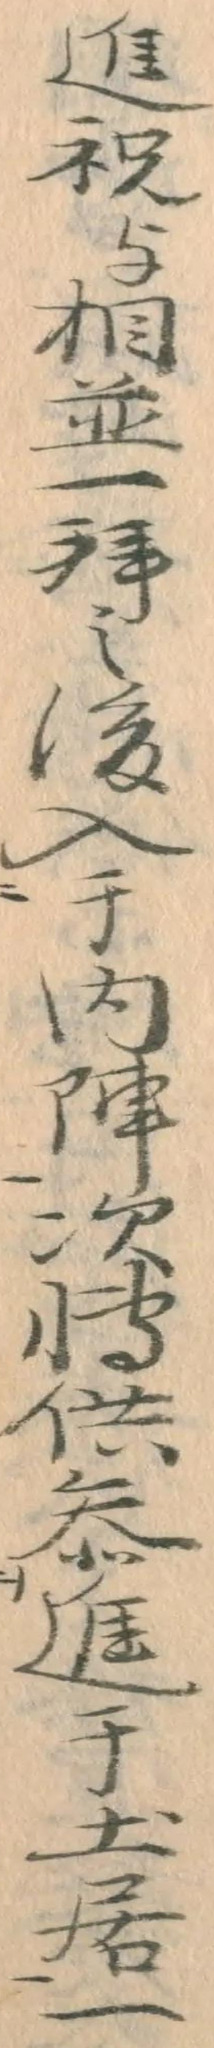進祝と相並一拝之後入于内陣次轉供参進于土居一
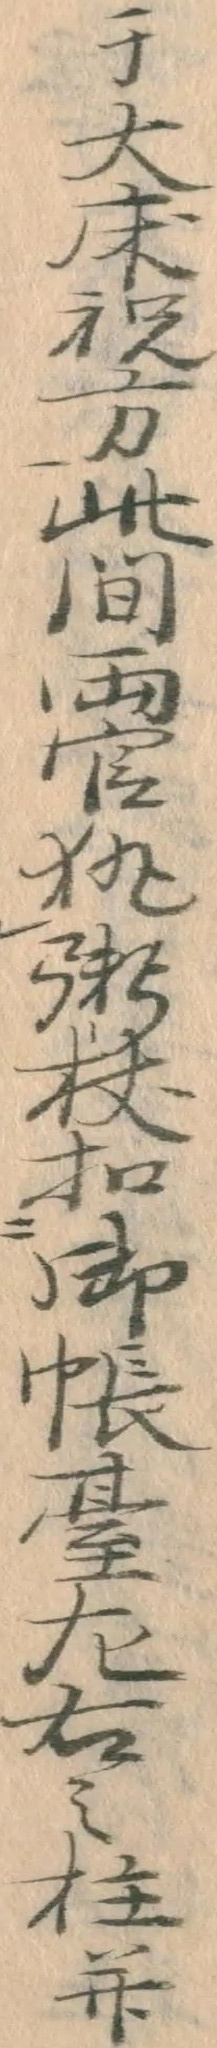于大床祝方此間両官執粥杖扣御帳臺左右之柱并
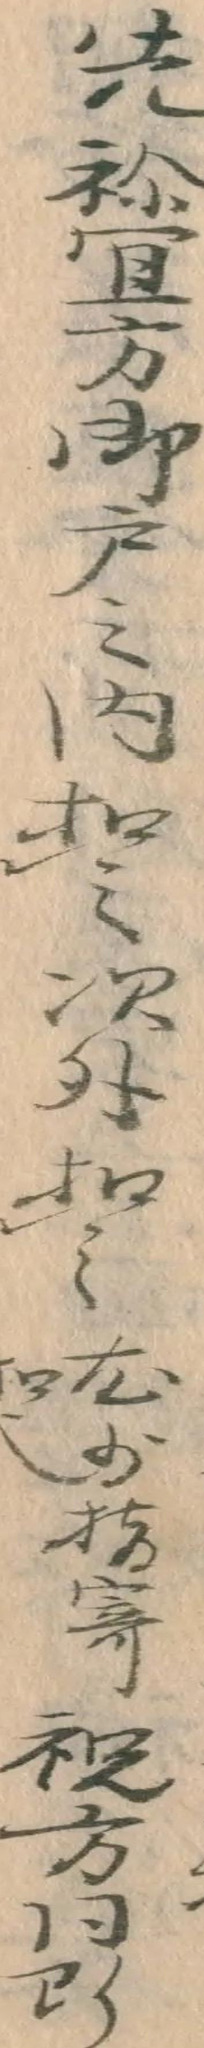先祢宜方御戸之内扣之次外扣之尤少指寄扣之祝方同断
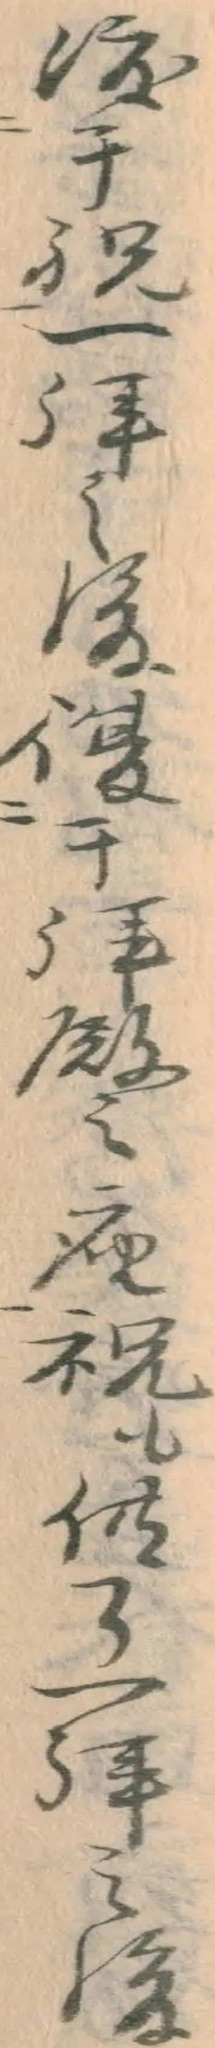渡于祝一拝之後復于拝殿之座祝も供了一拝の後
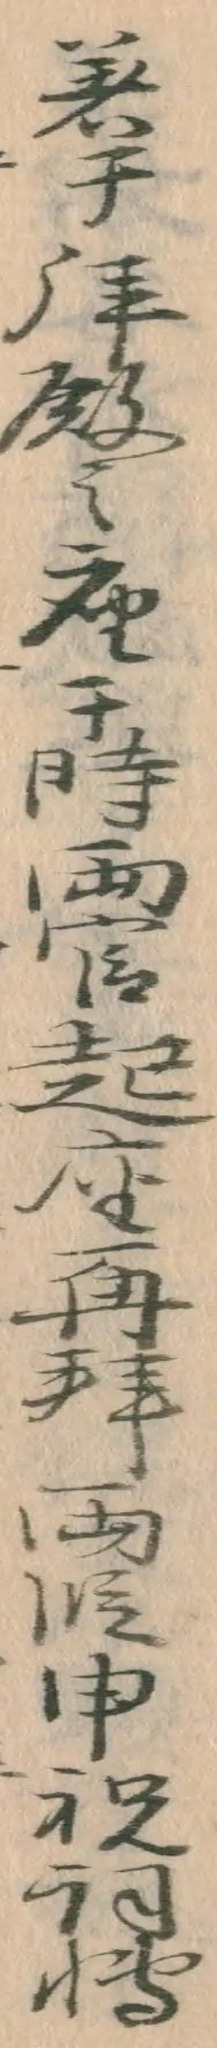着于拝殿之座于時両官起座再拝両段申祝詞轉
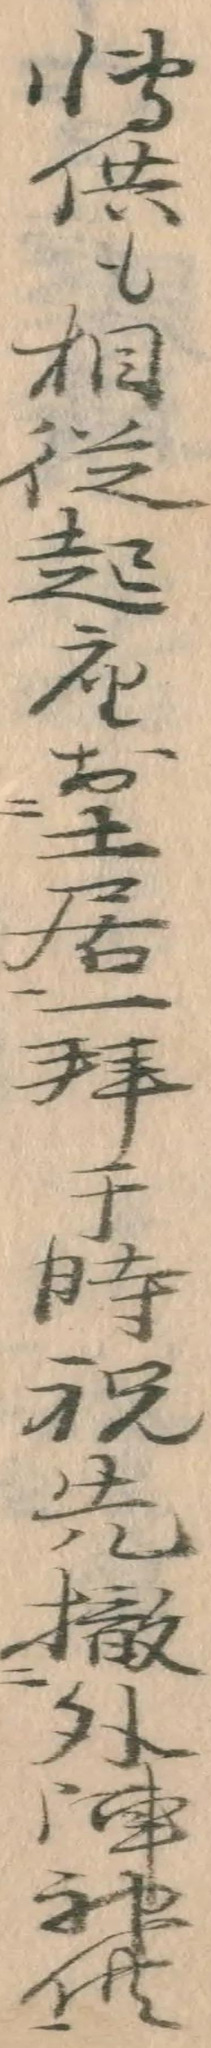轉供も相従起座於土居一拝于時祝先撤外陣神供
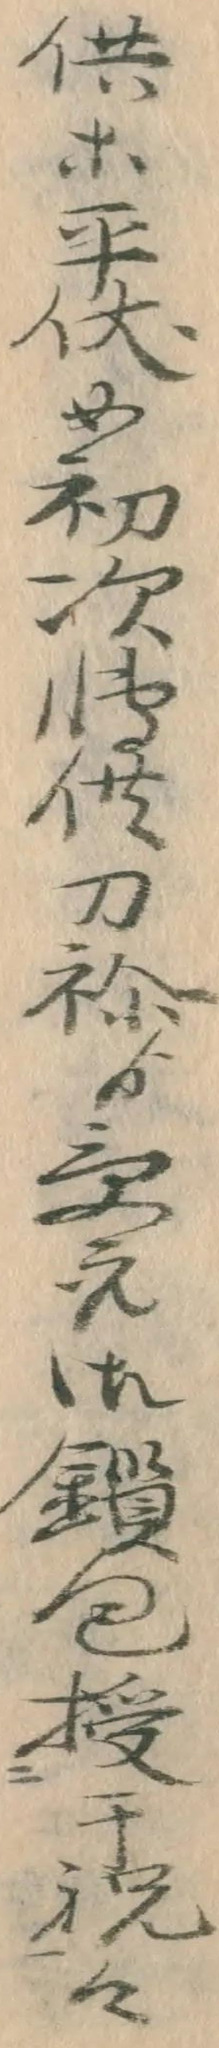供等平伏如初次轉供刀祢ゟ受取御鎖包授于祝々

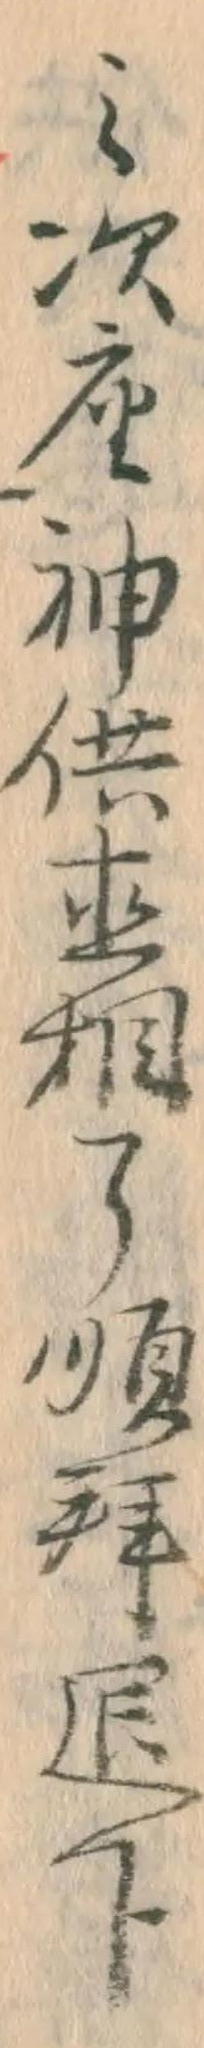之次座神供直相了順拜退下
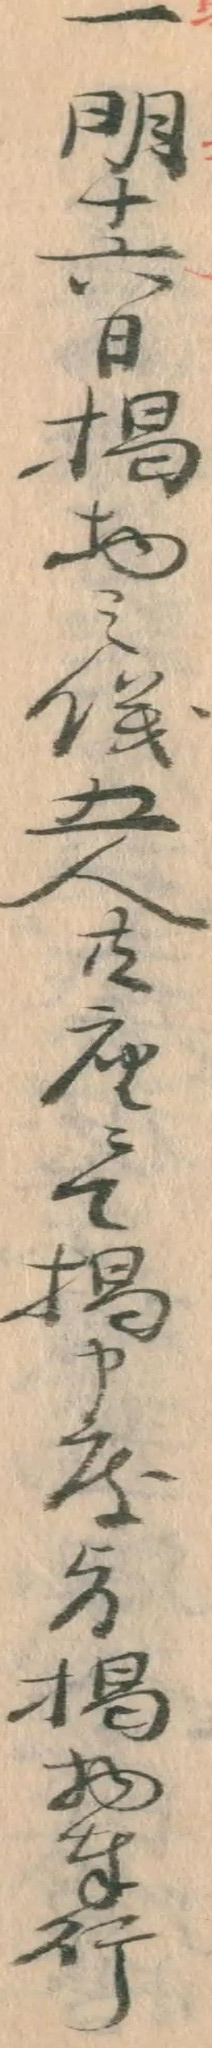一明十六日掲物之儀五人共座ニて掲申度旨掲物奉行
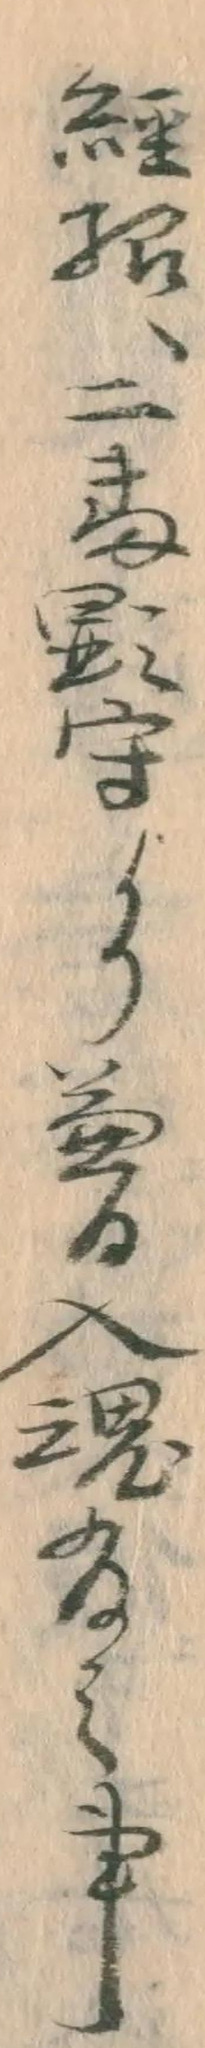経招ヘ二番顕守より兼日入魂之事
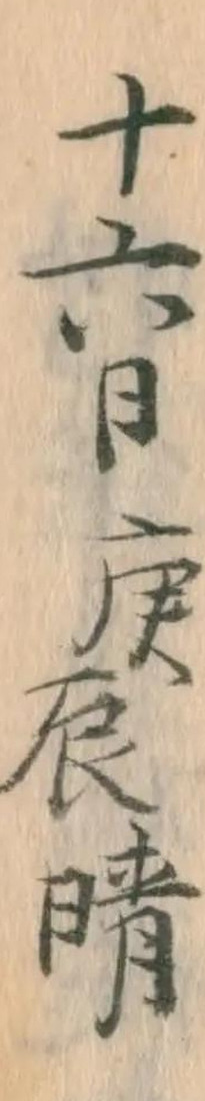十六日庚辰晴
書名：賀茂社記録. 第72冊
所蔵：国立国会図書館 National Diet Library, JAPAN
